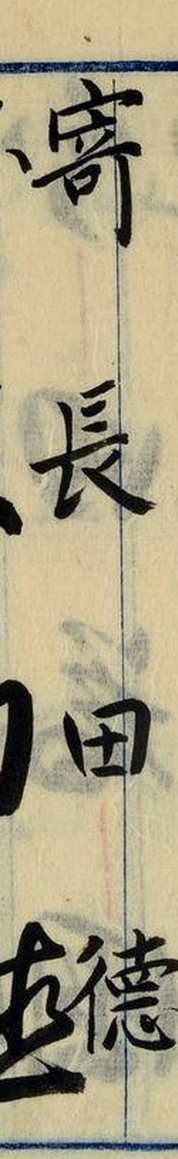寄長田徳
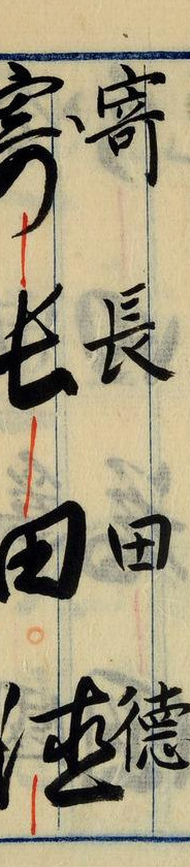寄長田徳
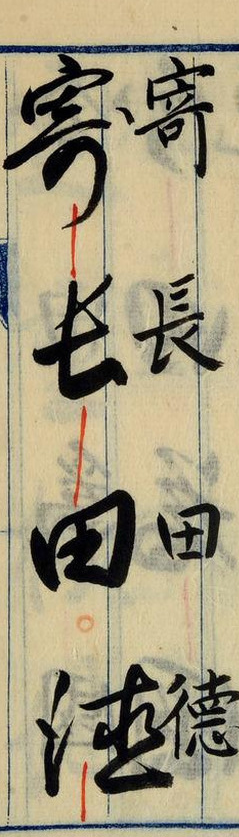寄長田徳

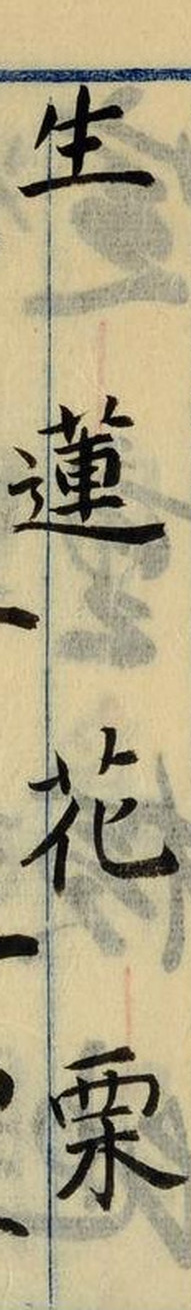生蓮花栗
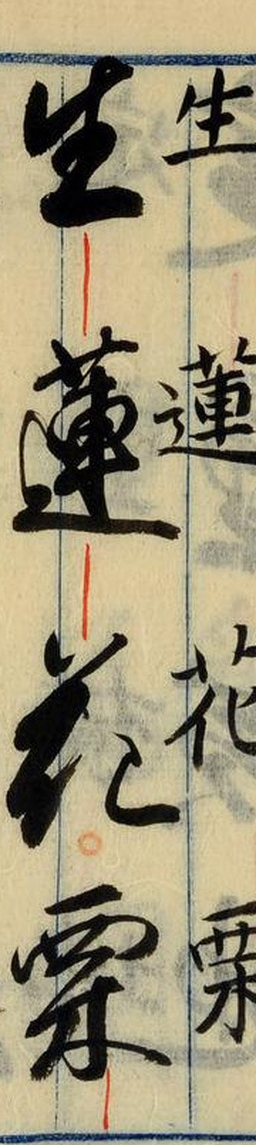生蓮花栗
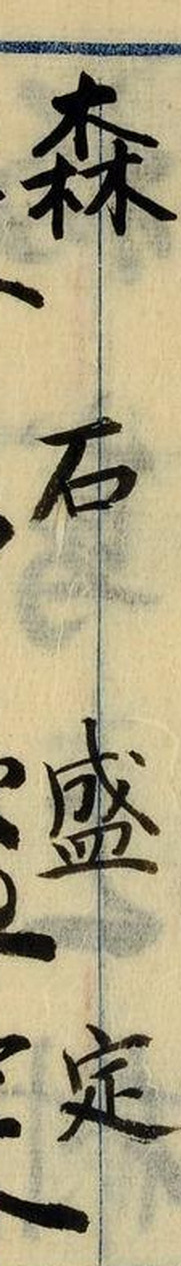森石盛定
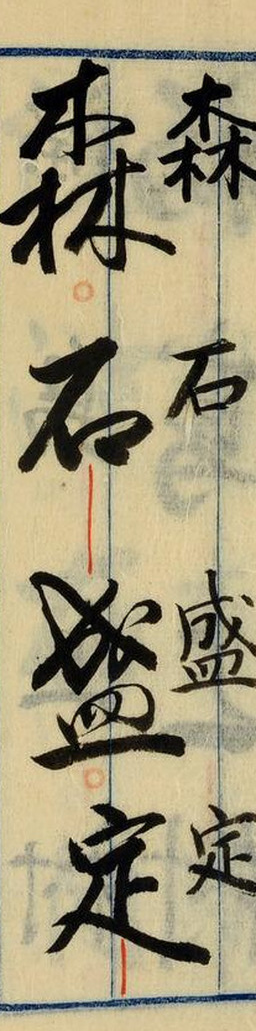森石盛定
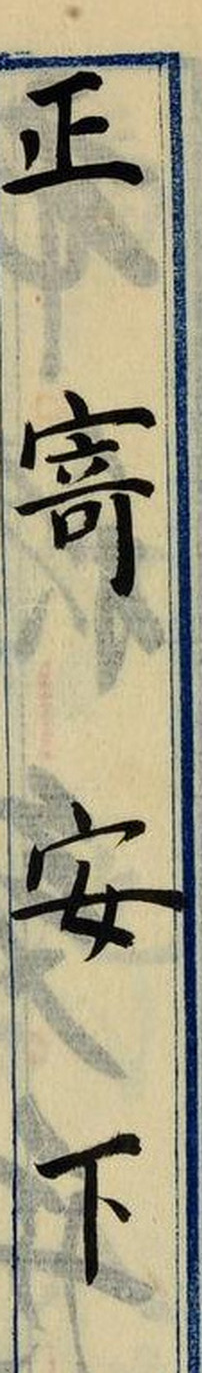正寄安下
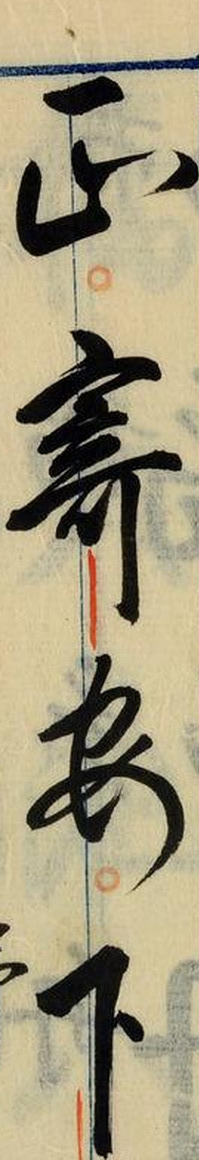正寄安下
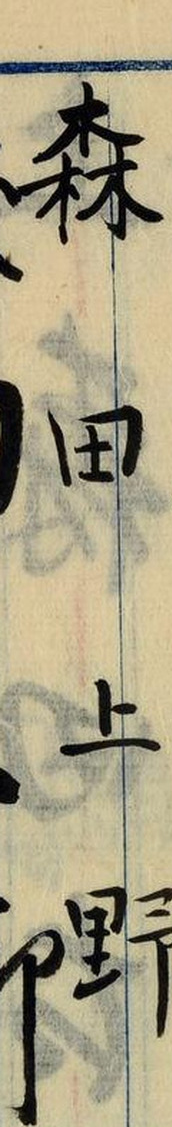森田上野
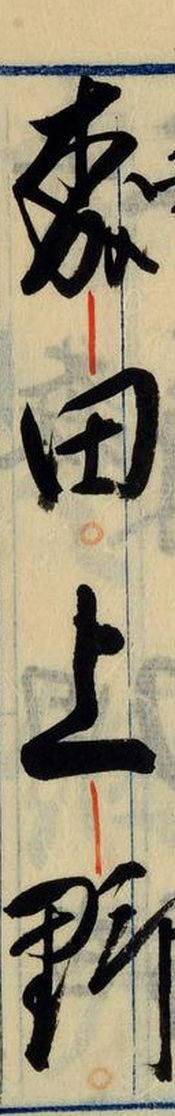森田上野

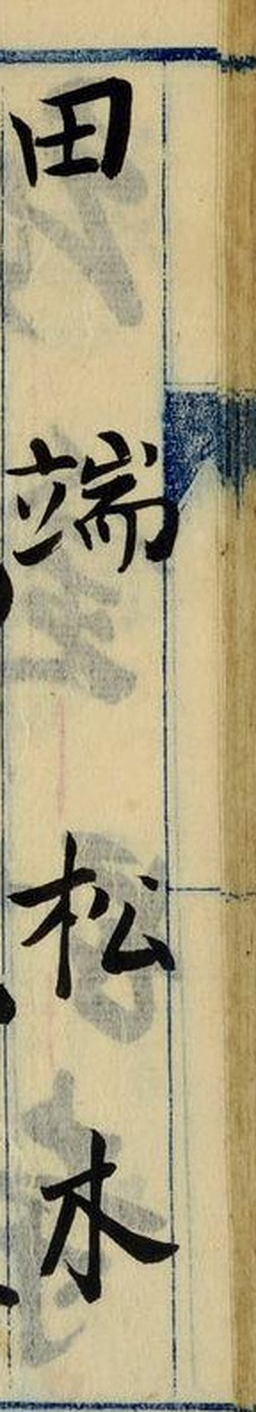田端松木
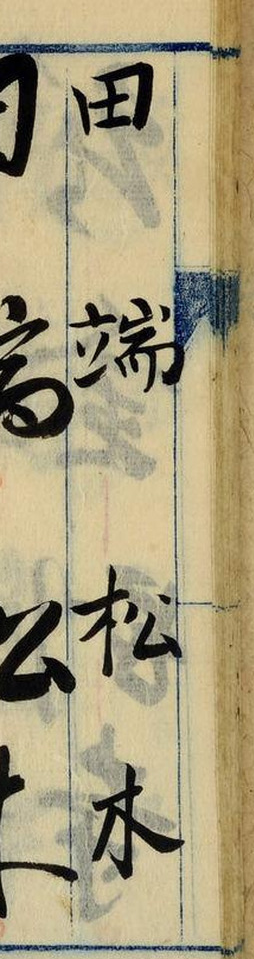田端松木
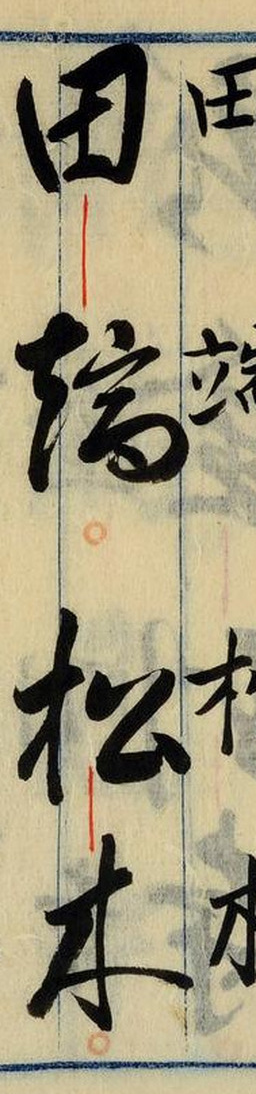田端松木
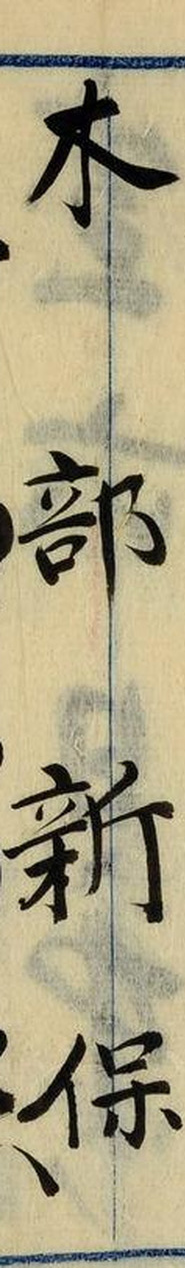木部新保
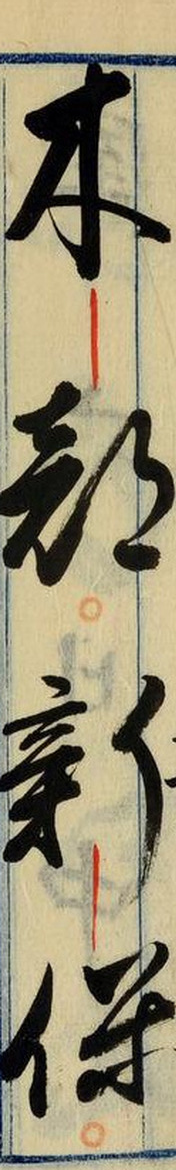木部新保
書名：村名・連語
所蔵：福井県文書館 Fukui Prefectural Archives
